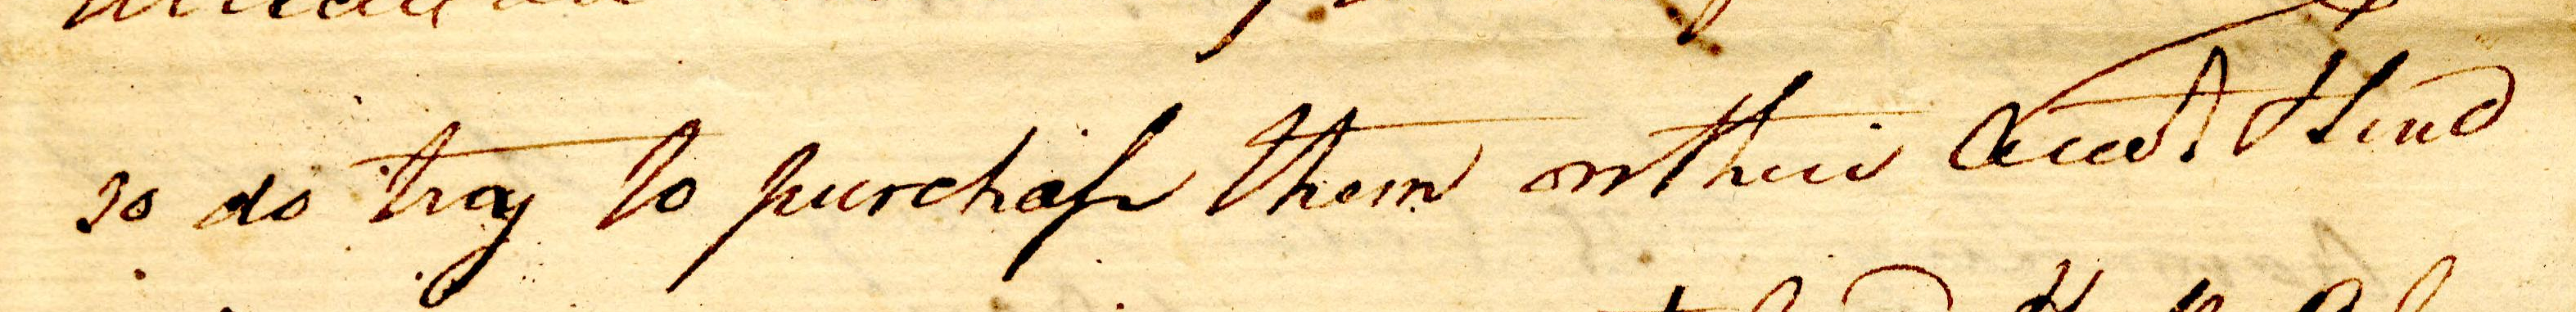so do try to purchase them on their Acc^t & Send
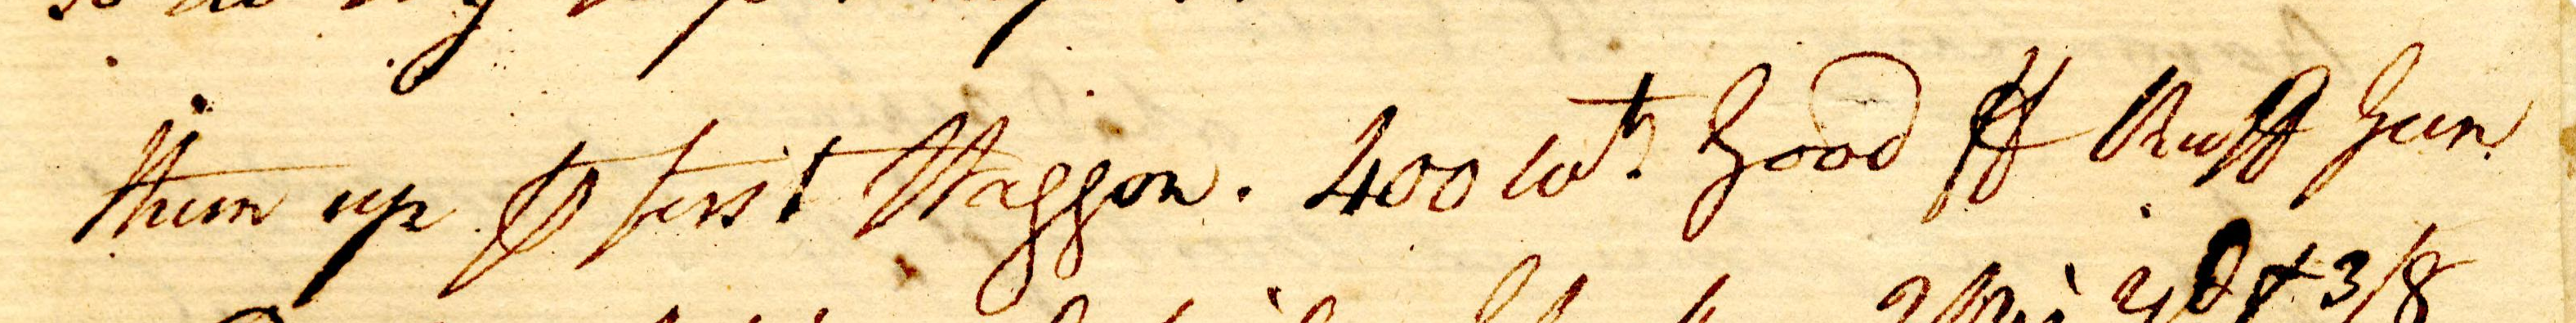them up per frst Waggon. 400 w^t. Good per ruff gun
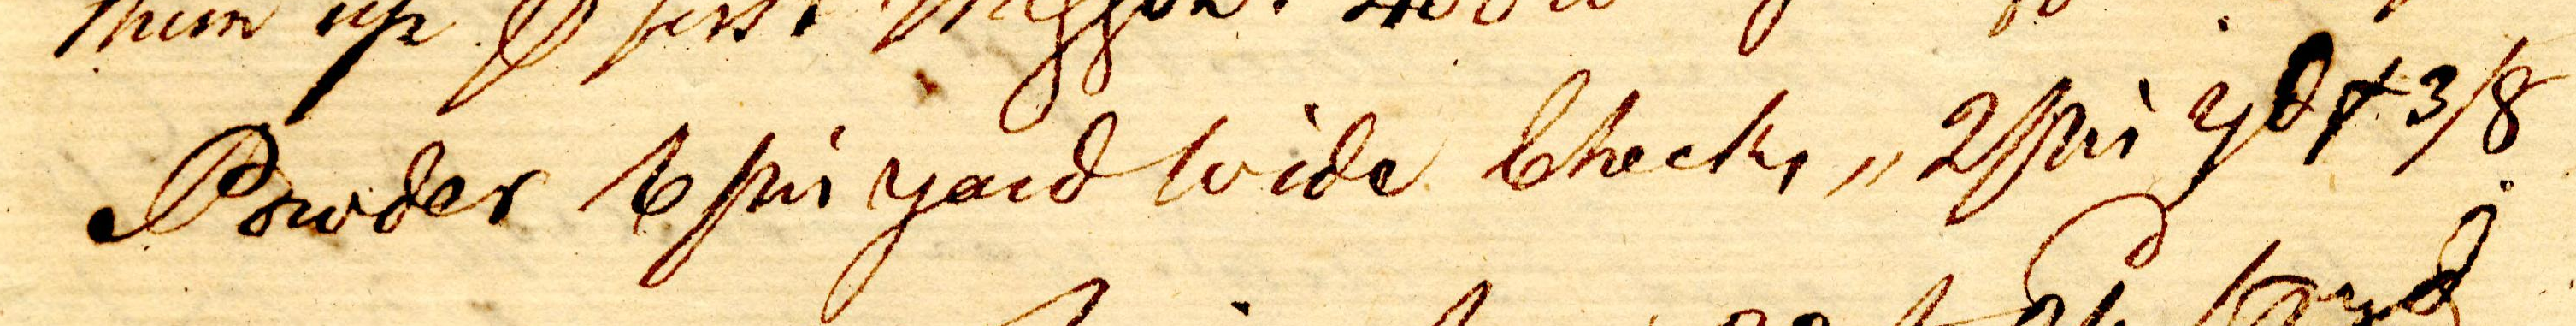Powder 6 per yard wide Checks, 2 perr y^d & 3/8
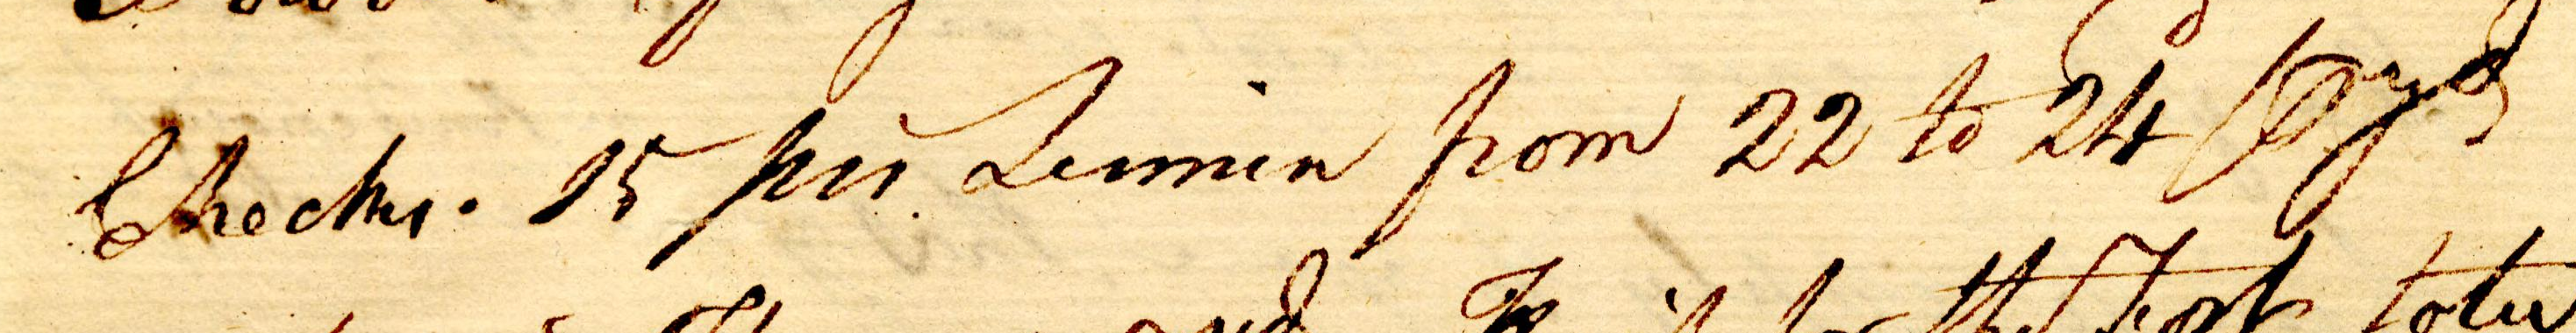Checks. 15 per Lemin from 22 to 24 per y^d.
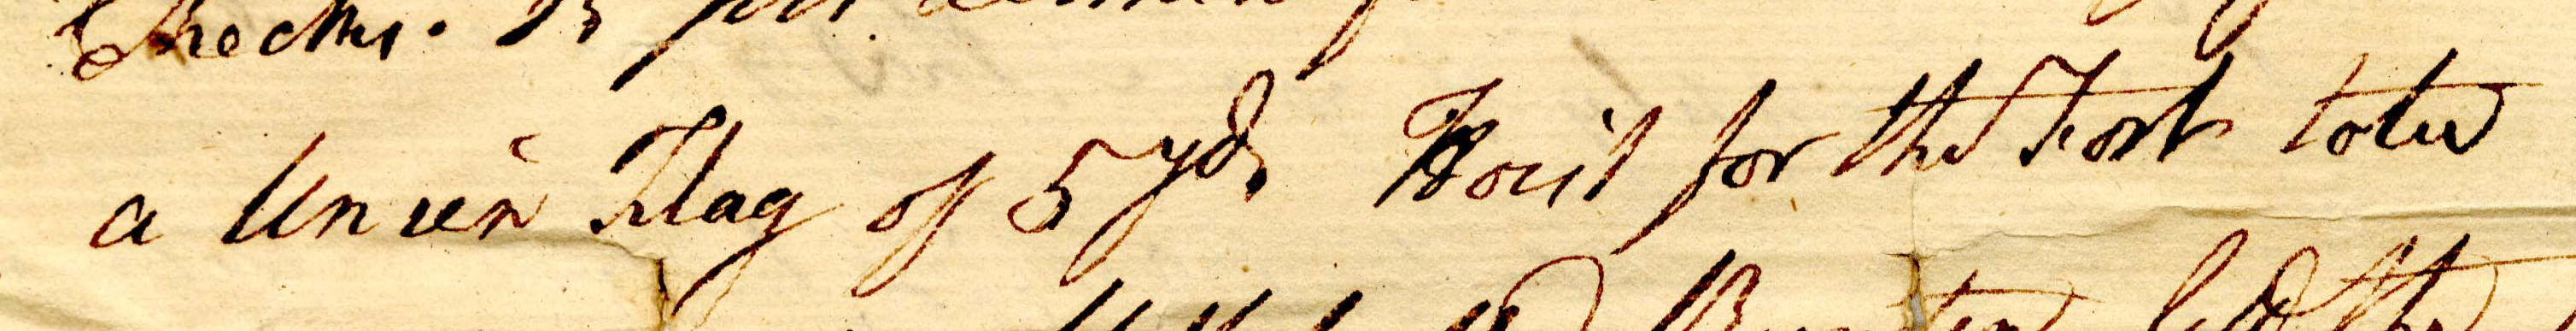a Union fag of 5^yd, Foul for the Fort to be
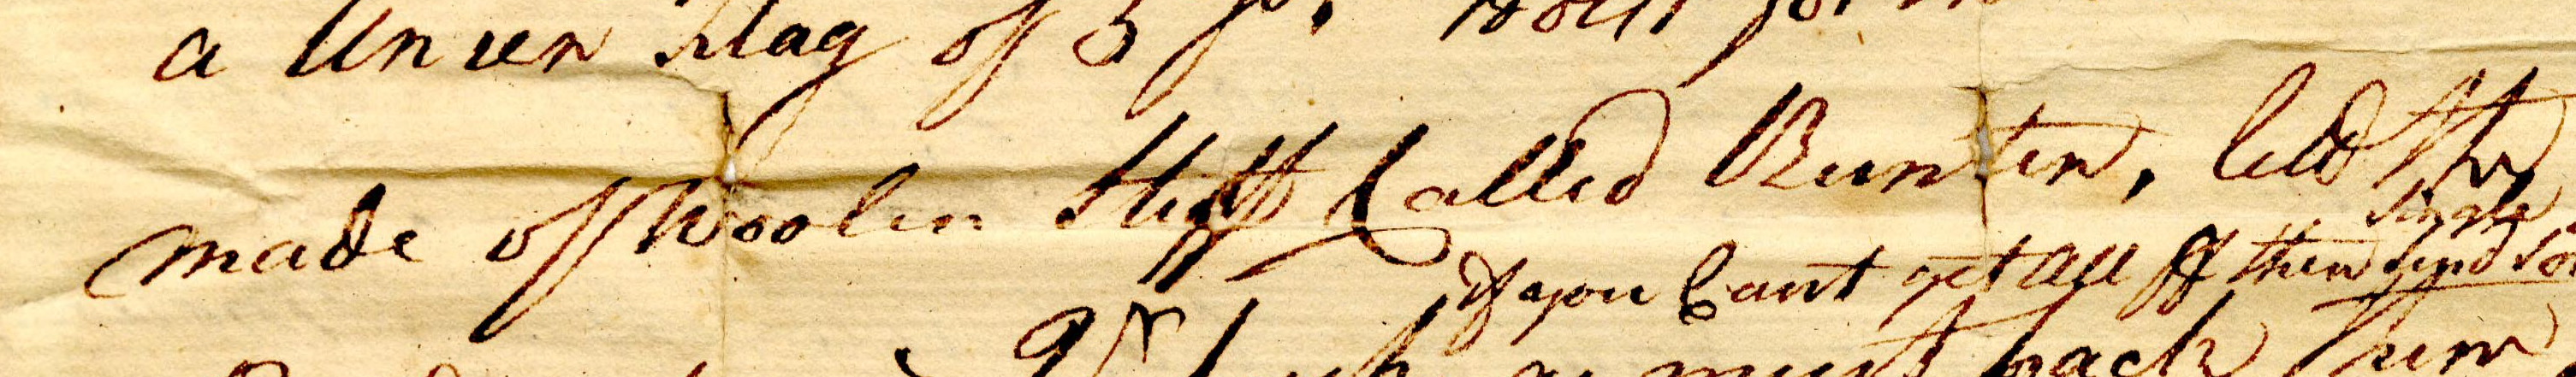made of Woolen Stuff Called Bunten, lett the
